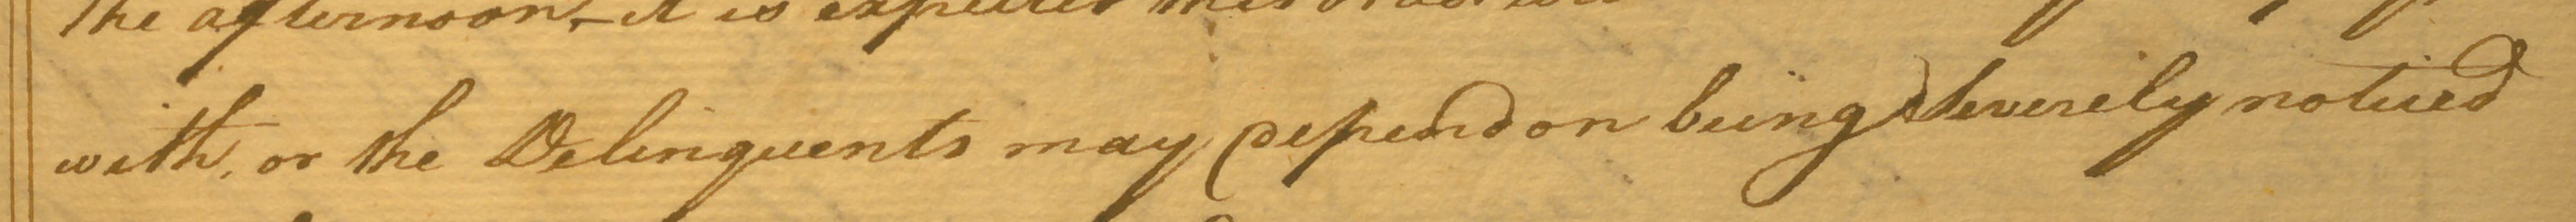with or the Delinquents may depend on being severely noticed
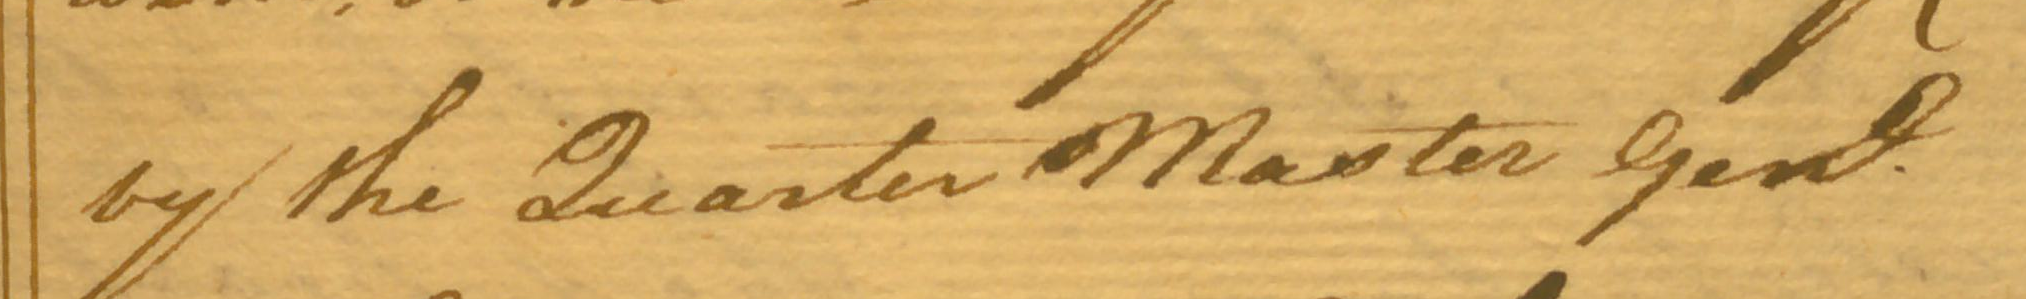by the Quarter Master Gen^l.
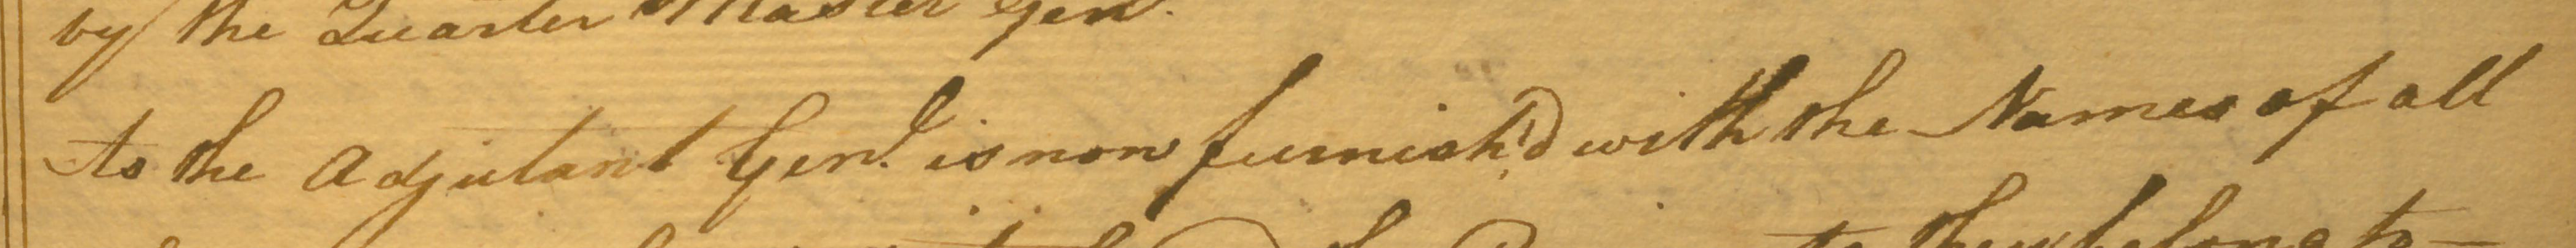As the Adjutant Gen^l. is now furnish'd with the Names of all
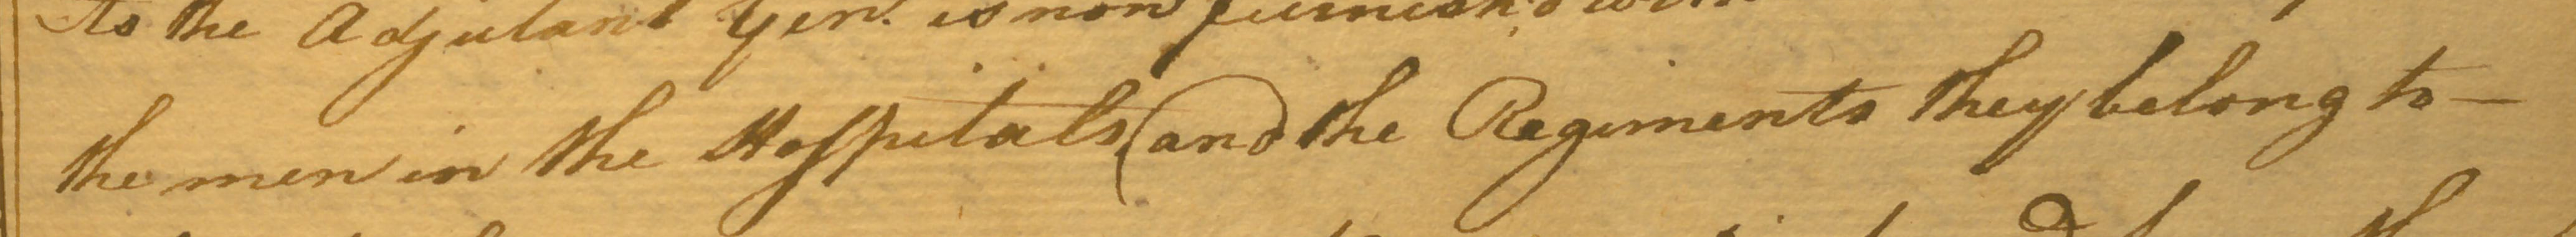the men in the Hospitals and the Regiments they belong to-
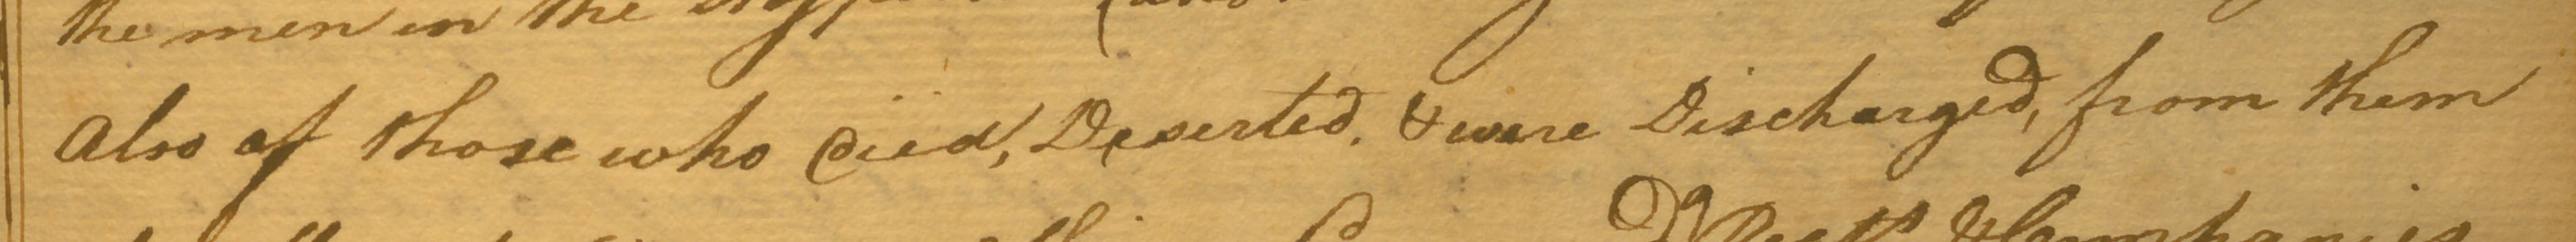Also of those who died, Departed, & were Discharged from them
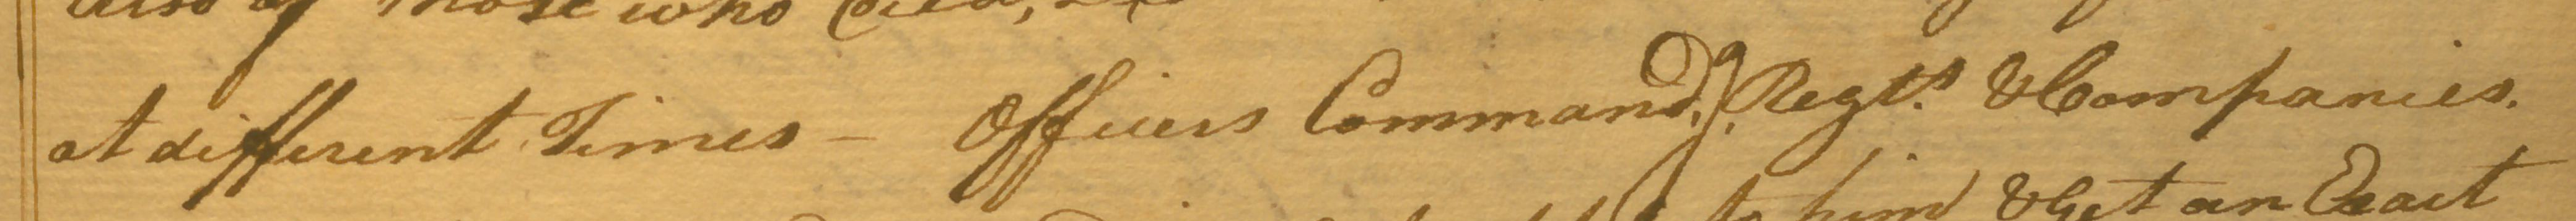at different Times- Officers Command^g. Reg^ts. & Companies
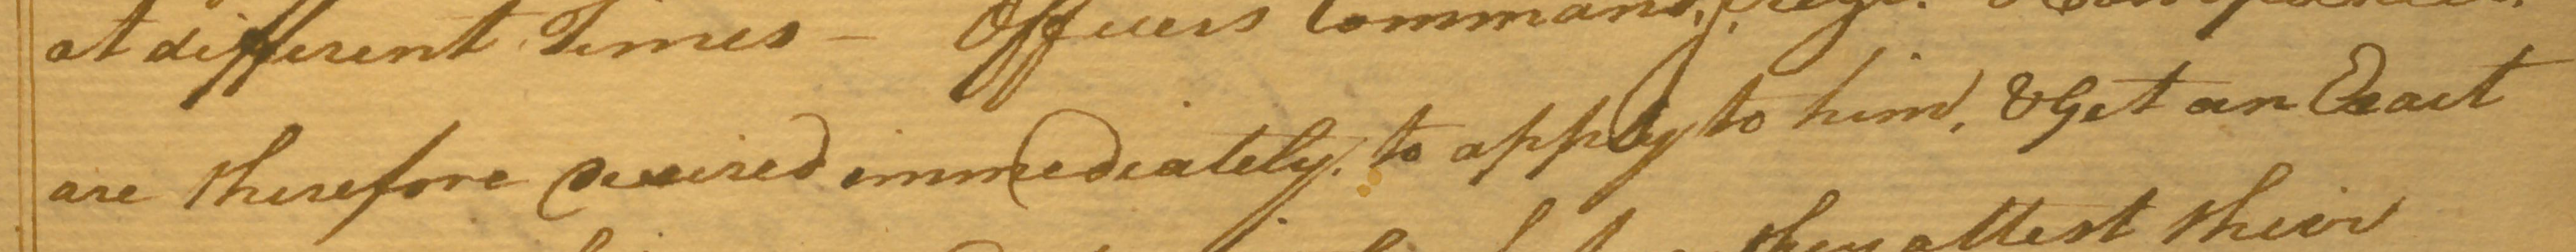are therefore desired immediately to apply to him & Get an Exact
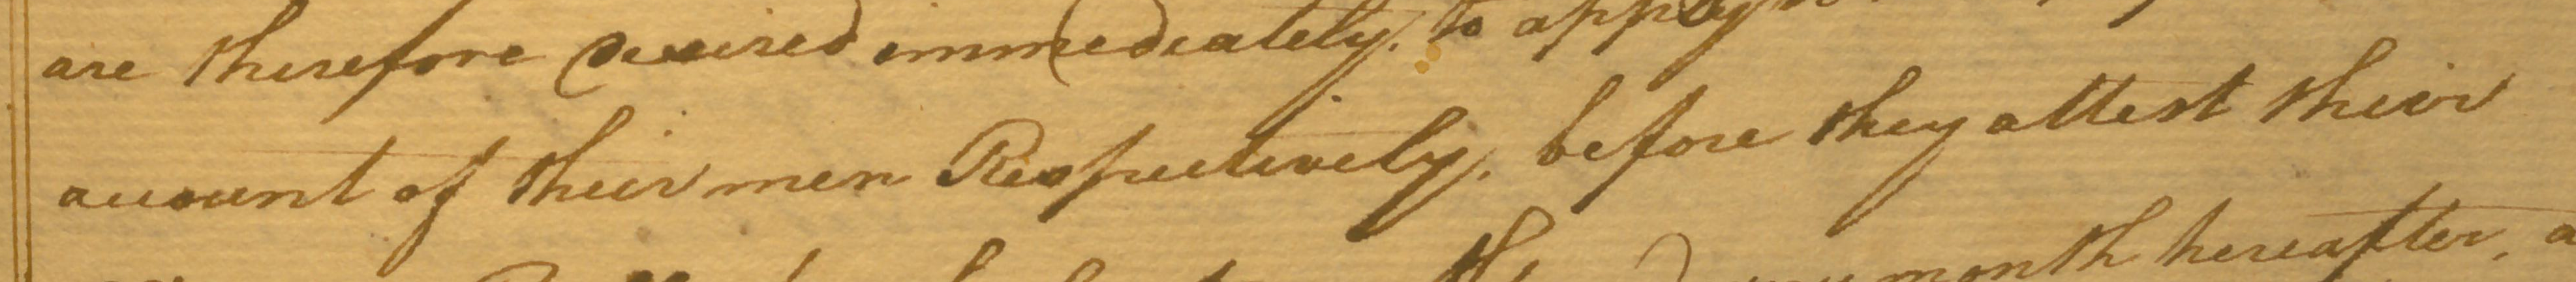account of their men Respectively before they attest their
